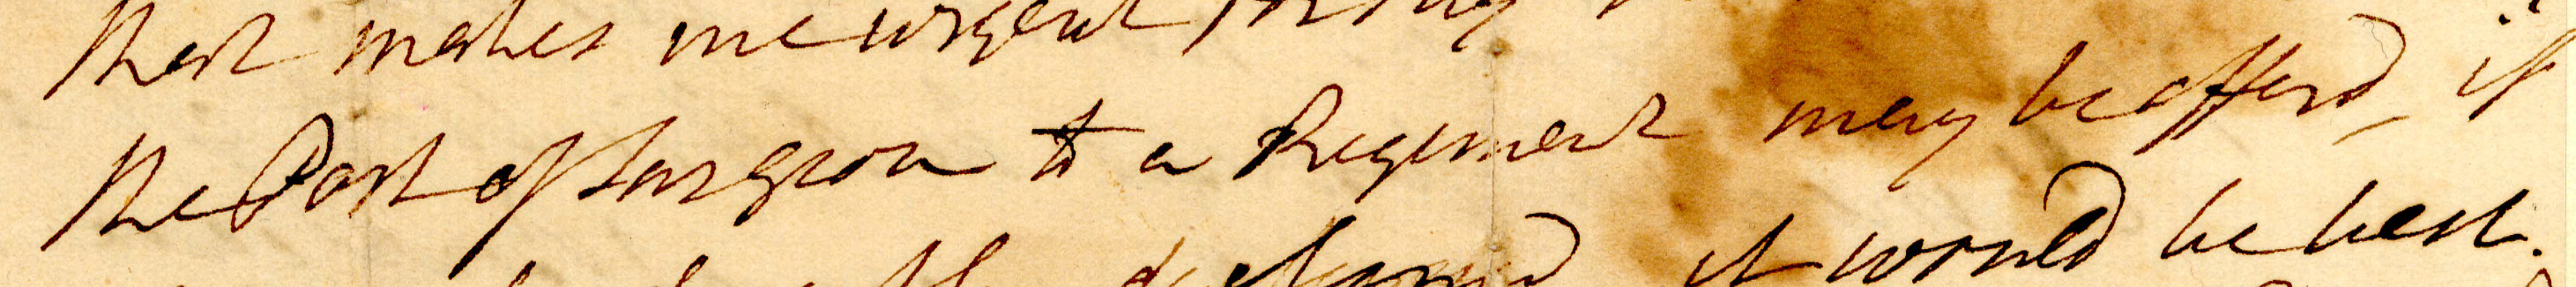the Part of Surgeon to a Regiment may be offered, if
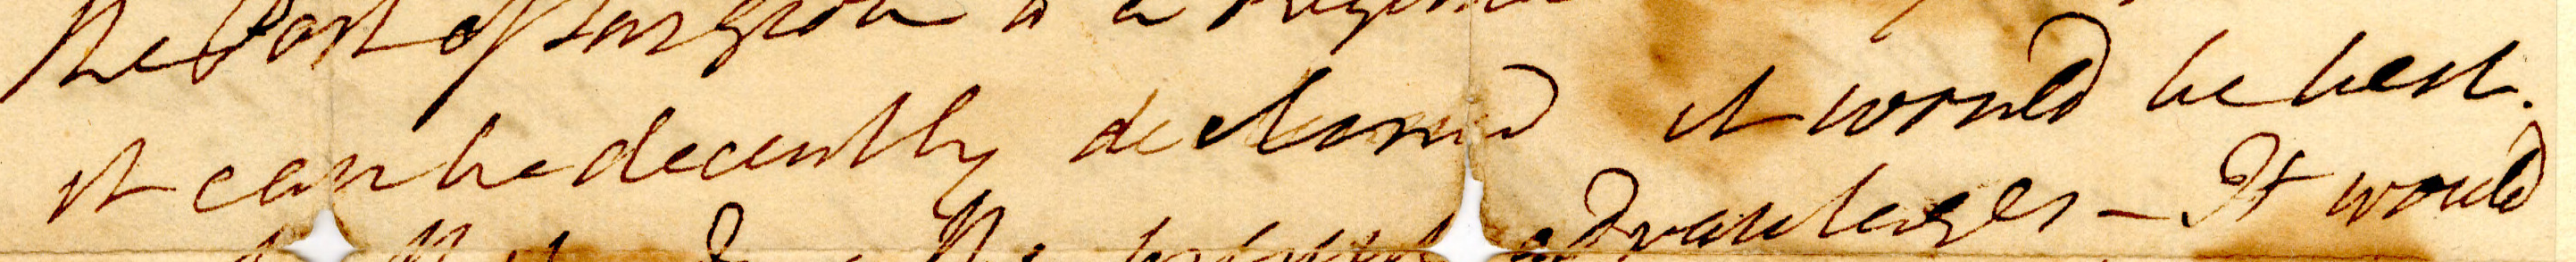it can be decently declamd it would be best.
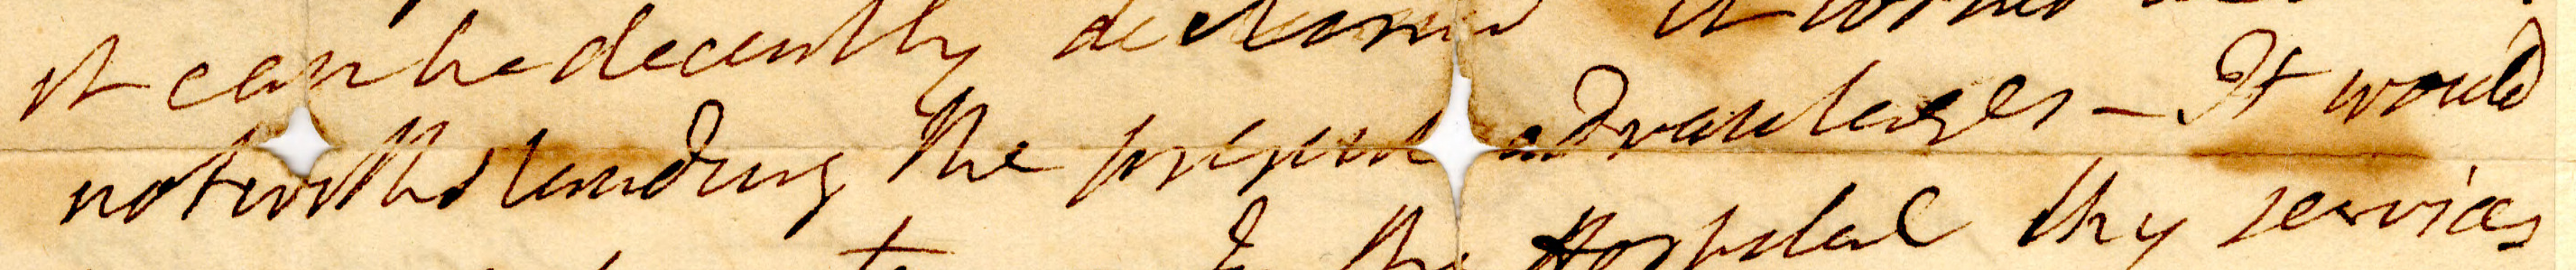notwithstanding the present advantages- It would
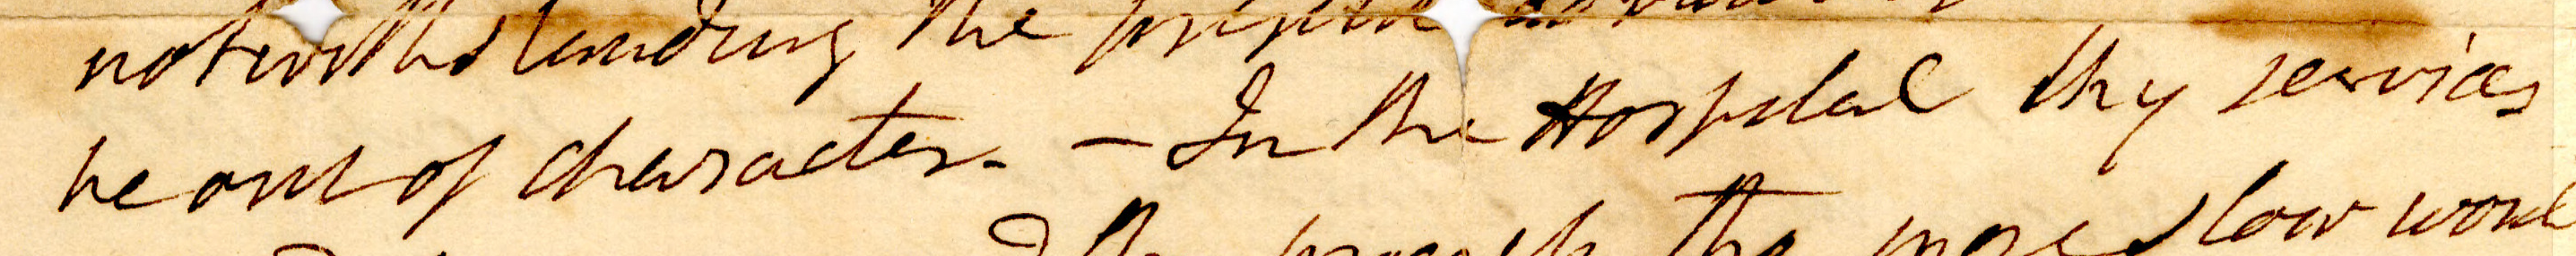be out of character.- In the Hospital thy services
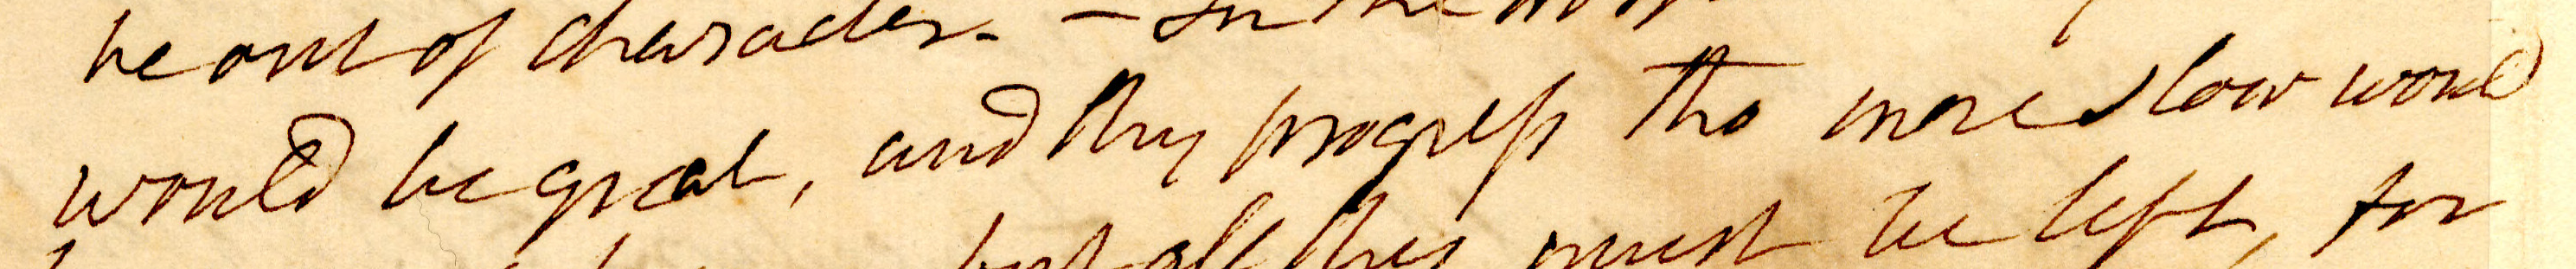would be great, and thy progress tho more slow would
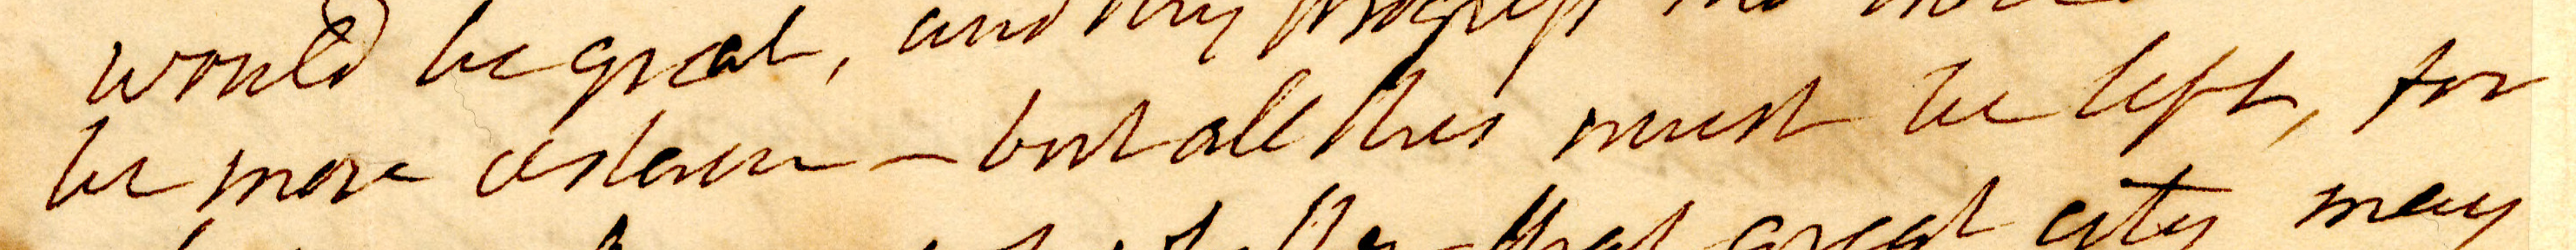be more certain- but all this must be left, for
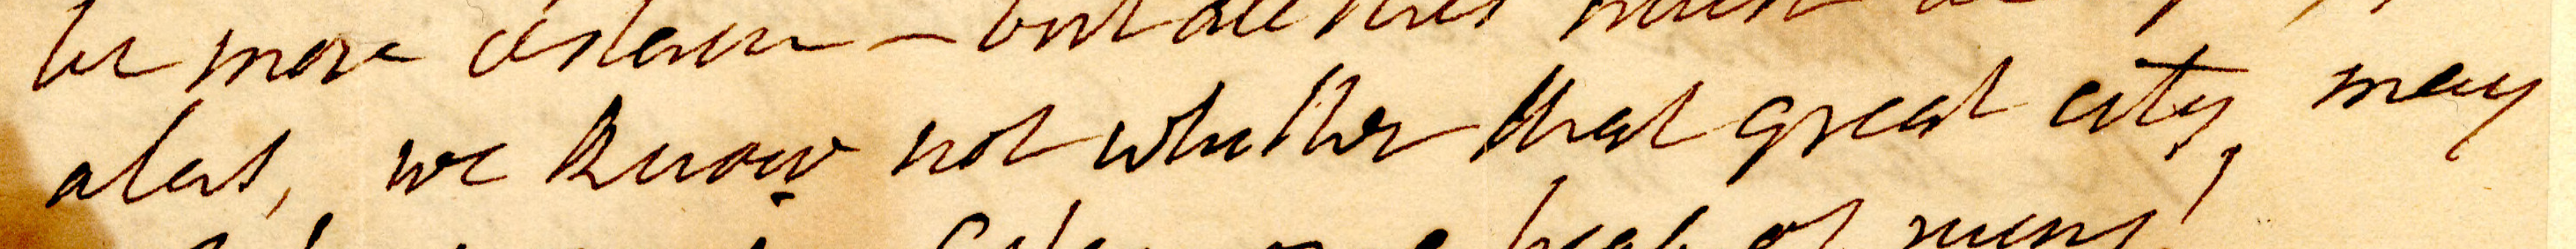alas, we know not whether that great city may
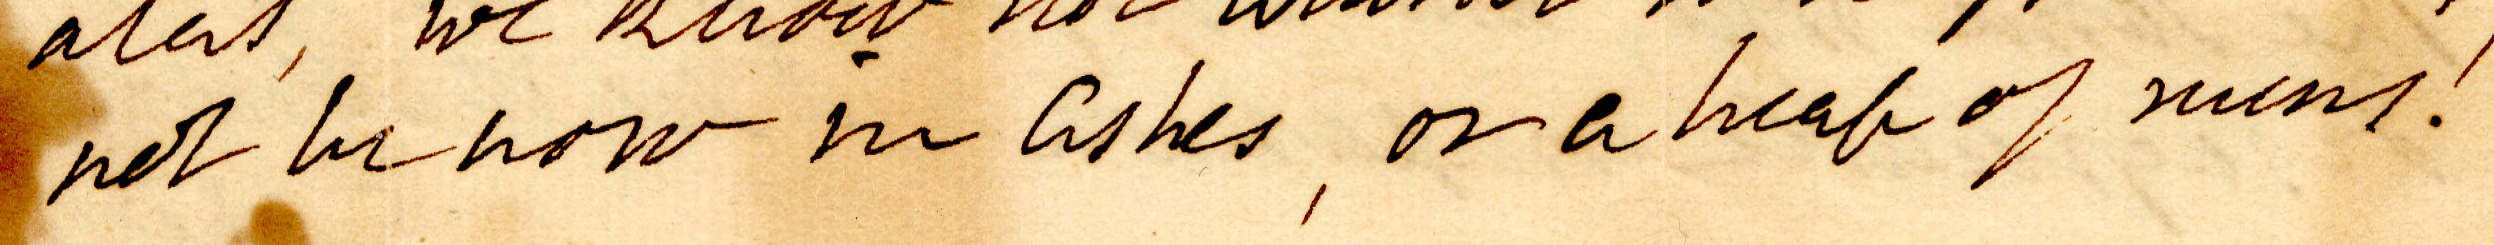not be now in Ashes, or a heap of ruins!
